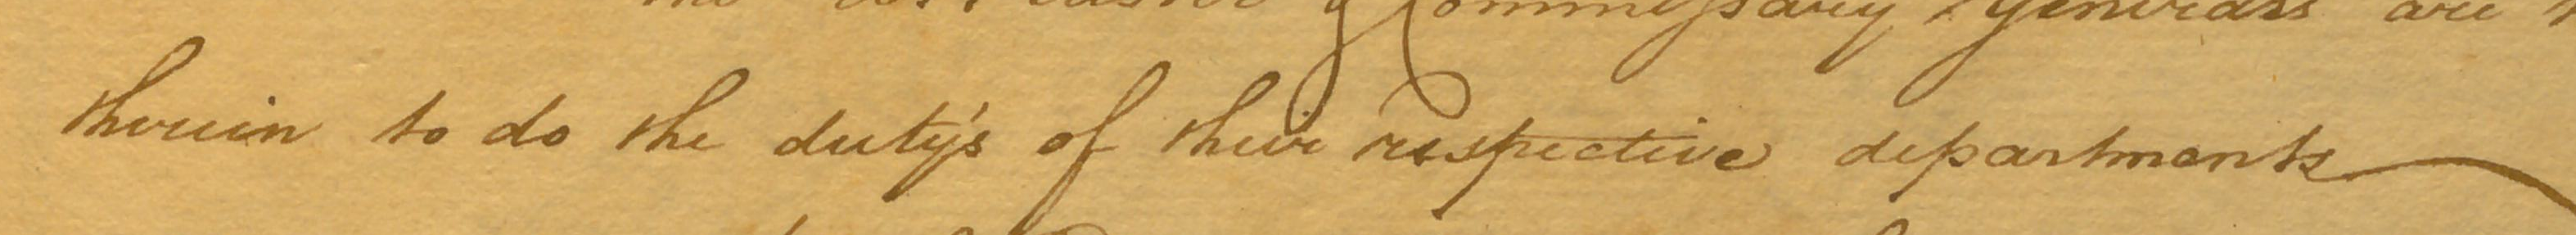therein to do the duty's of their respective departments-
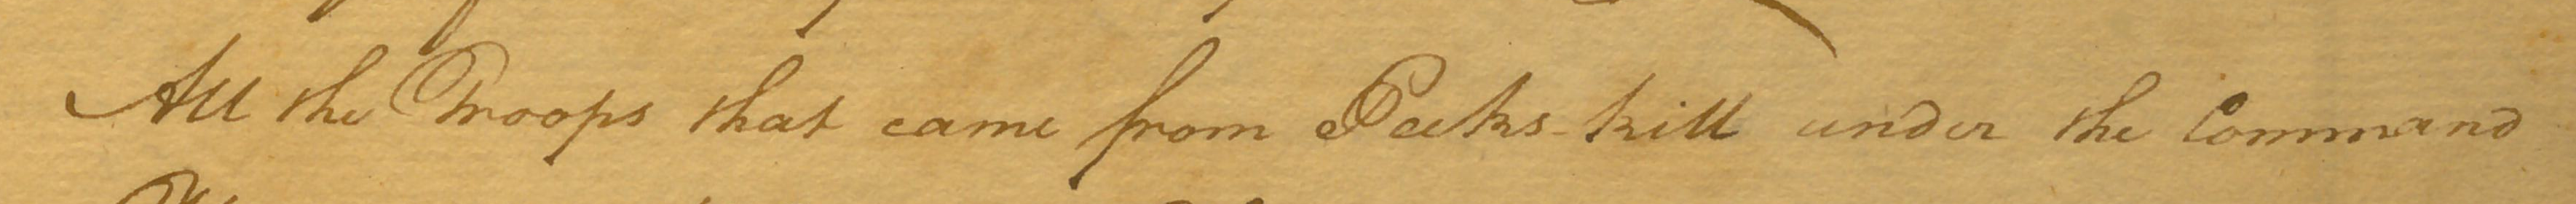All the Troops that came from Packs-kill under the Command
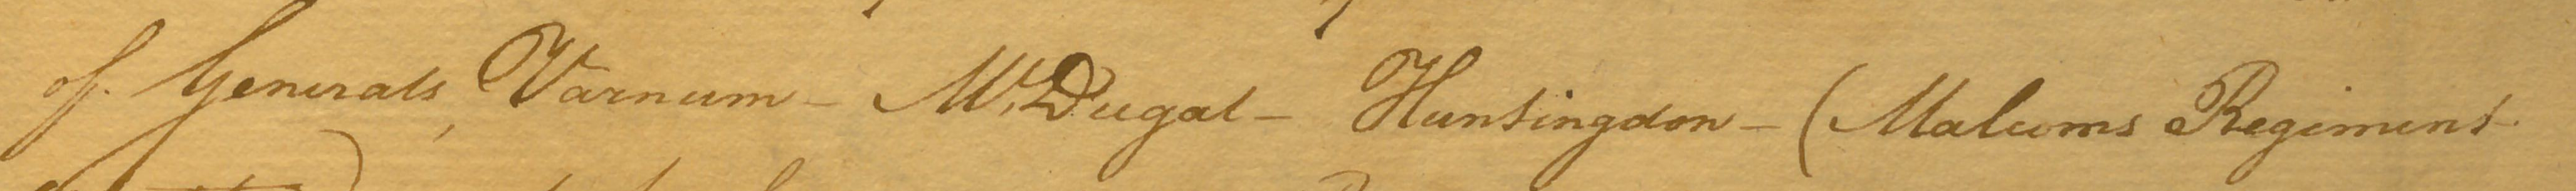of General Varnum- M^c Dugal- Huntingdon- (Malcoms Regiment
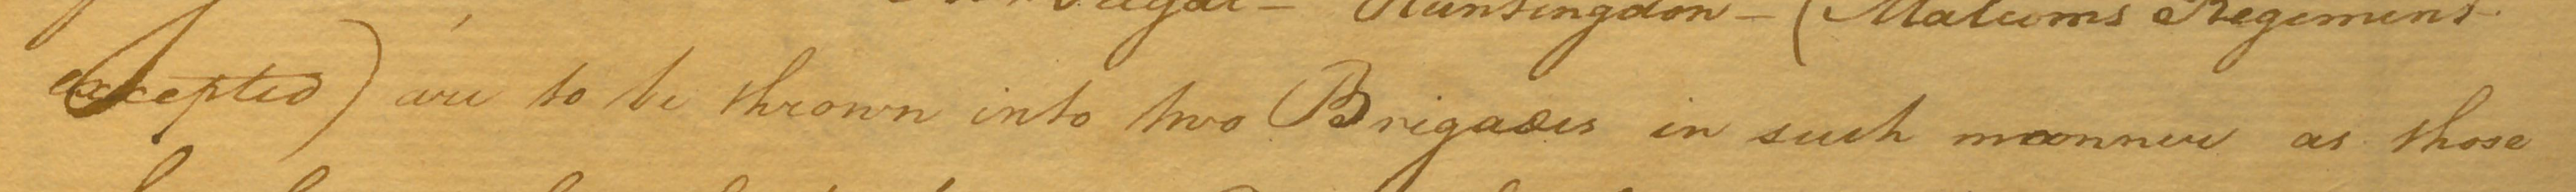excepted) are to be thrown into two Brigades in such manner as those
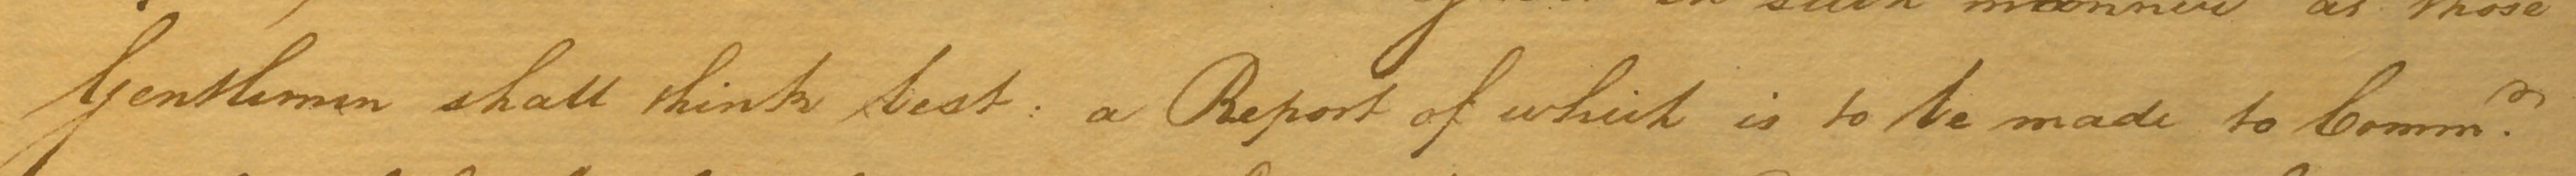Gentlemen shall think best: a Report of which is to be made to Comm^r.
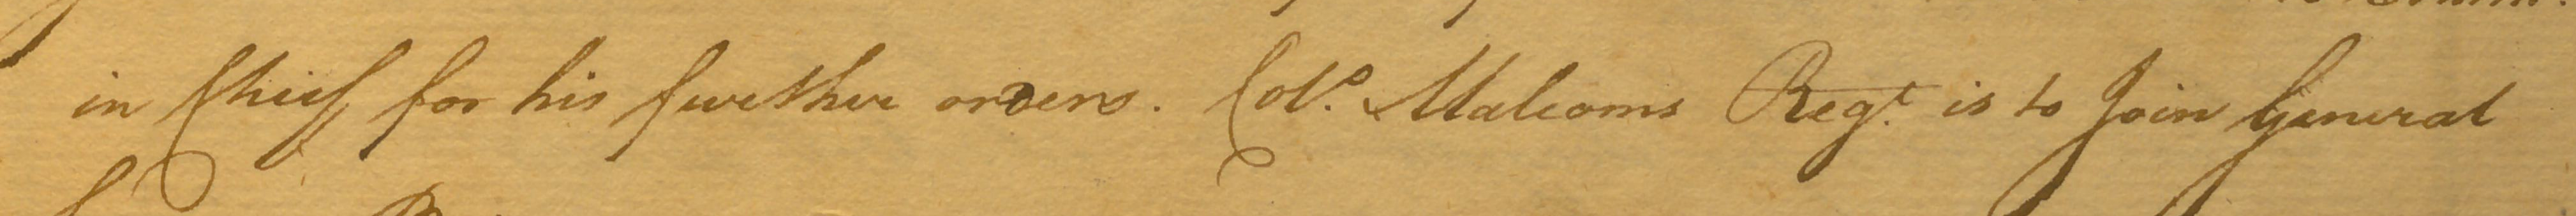in Chief for his further orders. Col^o. Malcoms Reg^t. is to join General
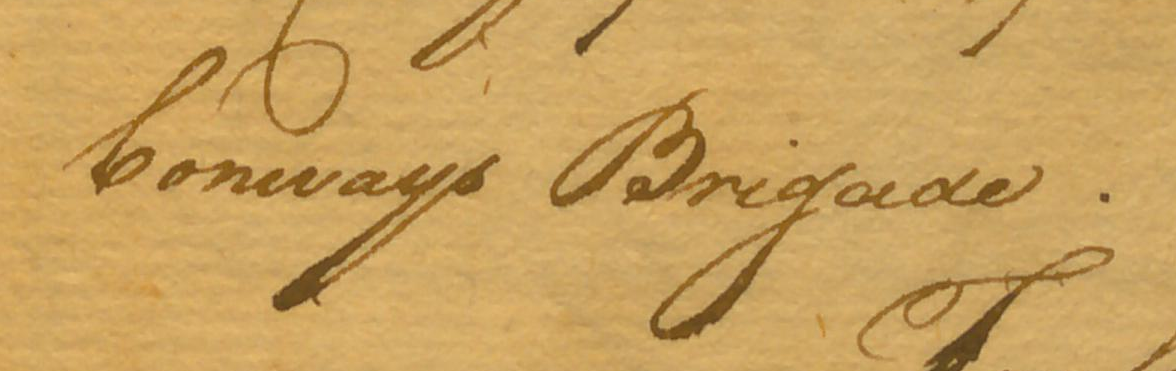Conways Brigade.
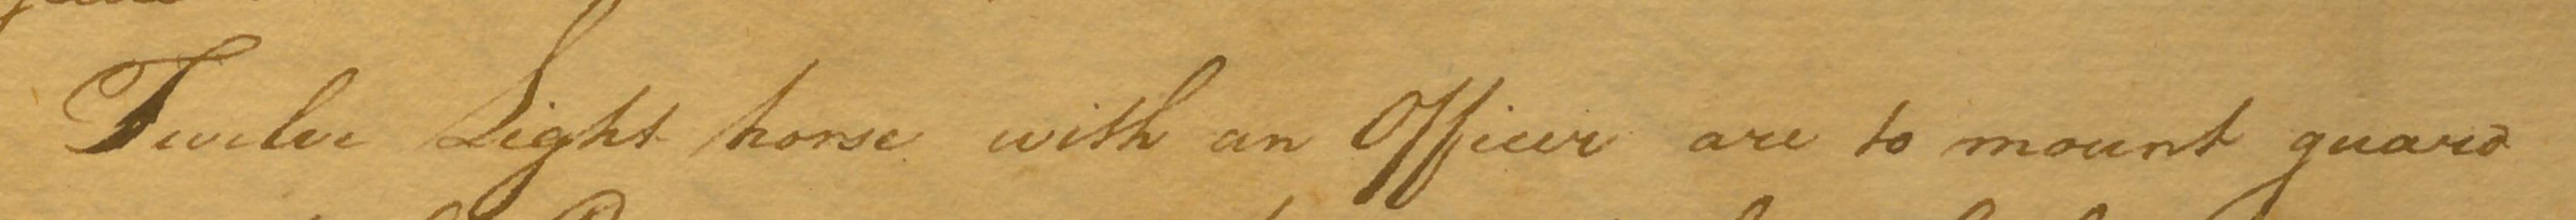Twelve Light horse with an Officer are to mount guard
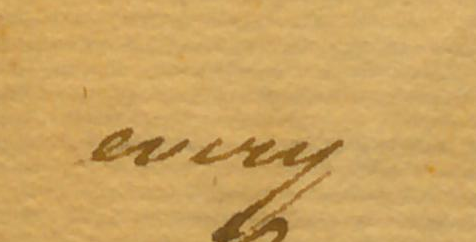every
